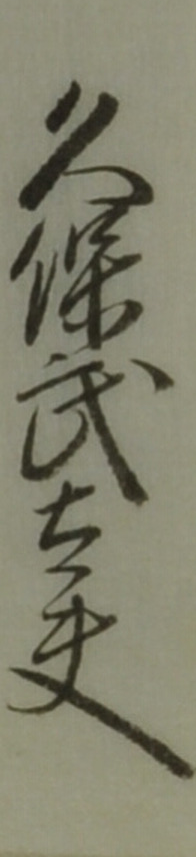久保武太夫
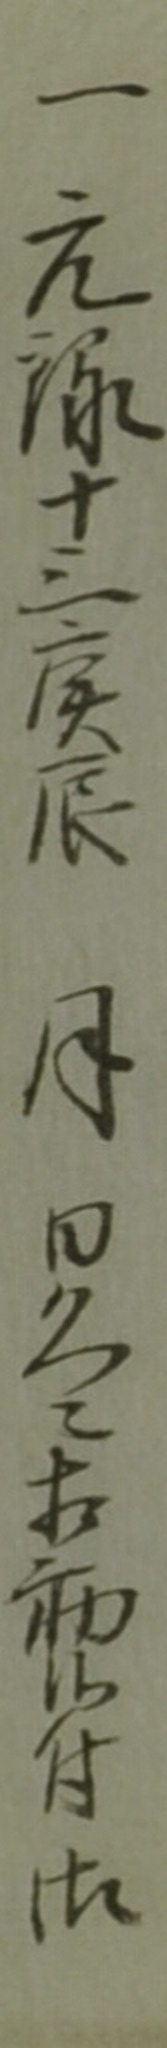一元禄十三庚辰月日久々相勤候付御
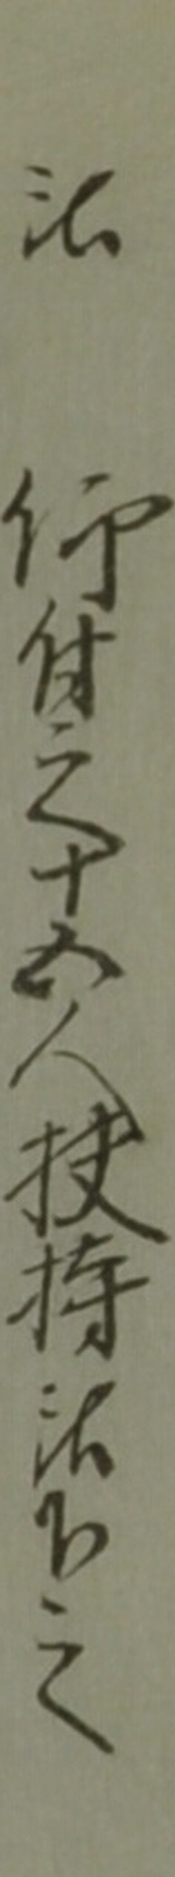被仰付之十五人扶持被下之
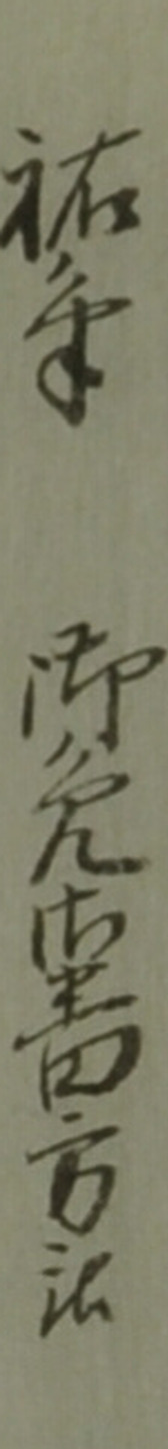祐筆御免御番方被
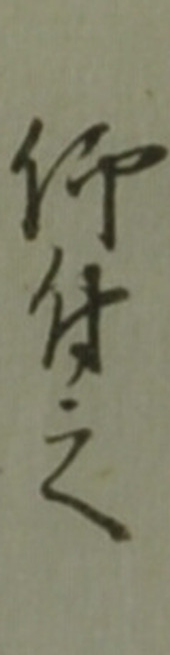仰付之
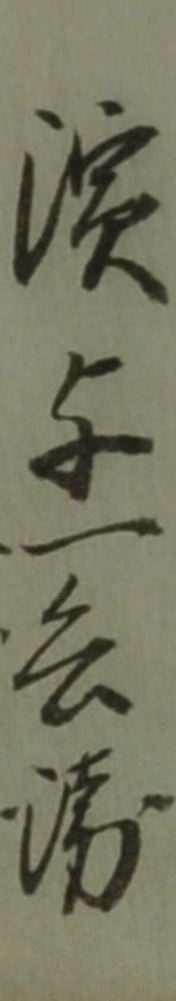濱与一兵衛
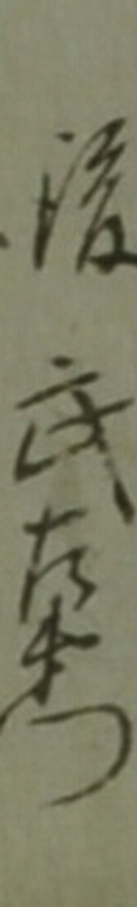後武左衛門
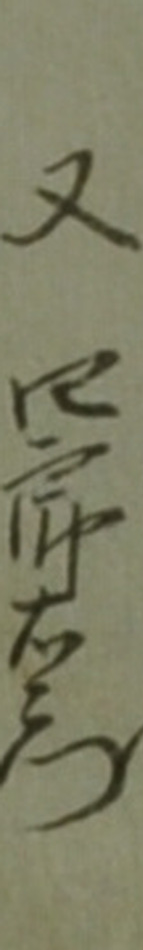又四郎右衛門
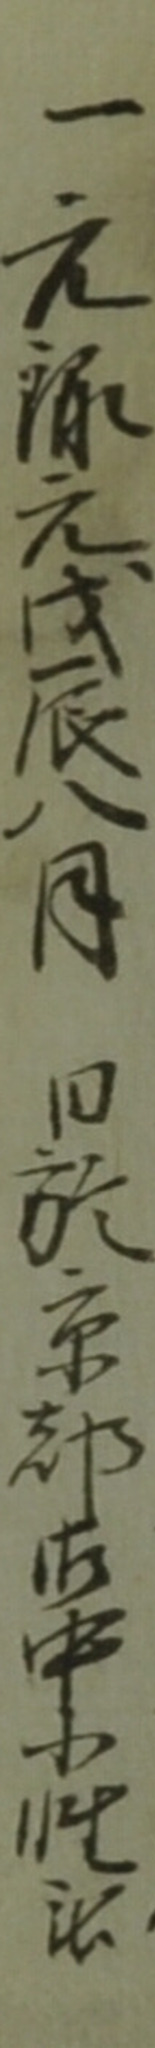一元禄元戊辰八月日於京都御中小性被
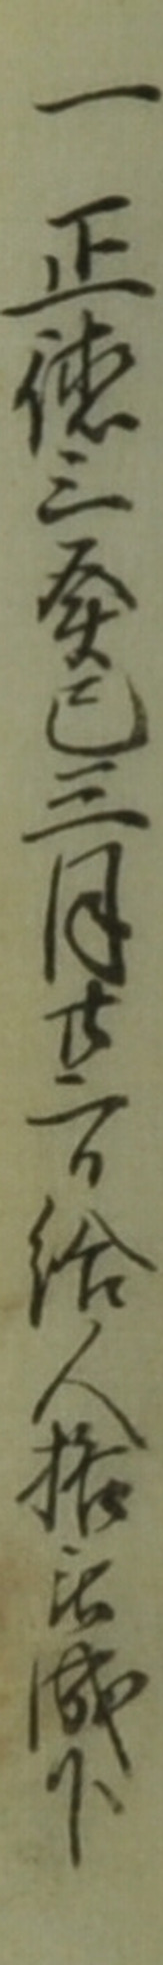一正徳三癸巳三月廿二日給人格被成下
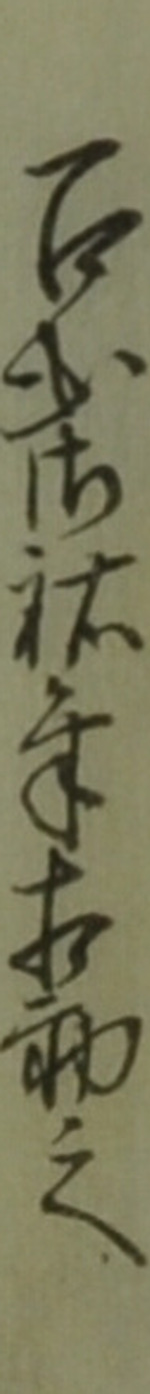召出御祐筆相勤之

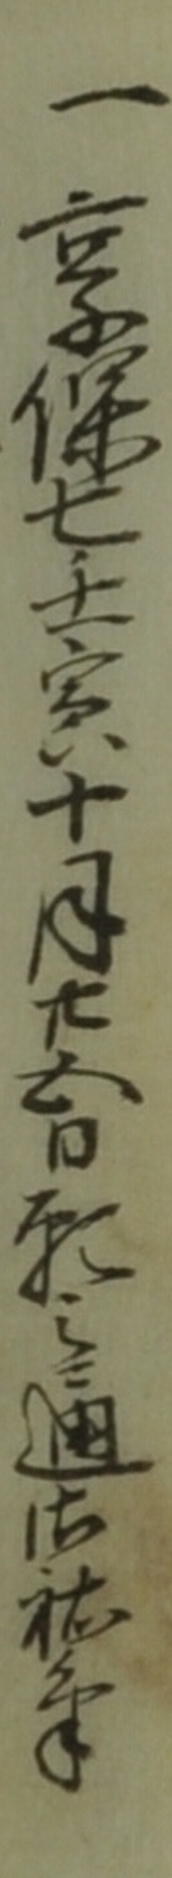一享保七壬寅十月廿五日願之通御祐筆
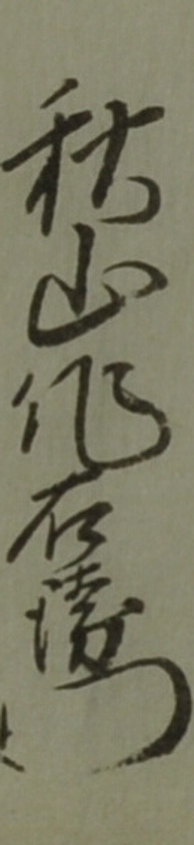秋山作右衛門
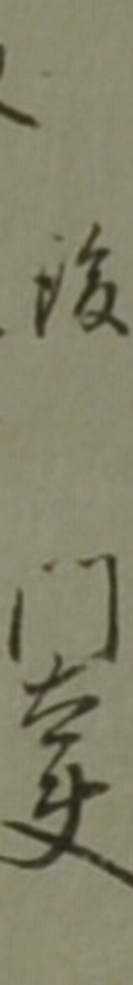後門太夫
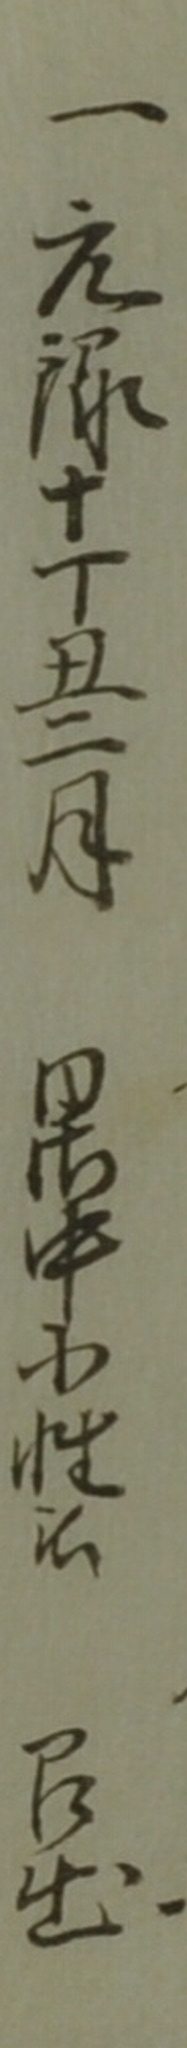一元禄十丁丑二月日御中小性召出
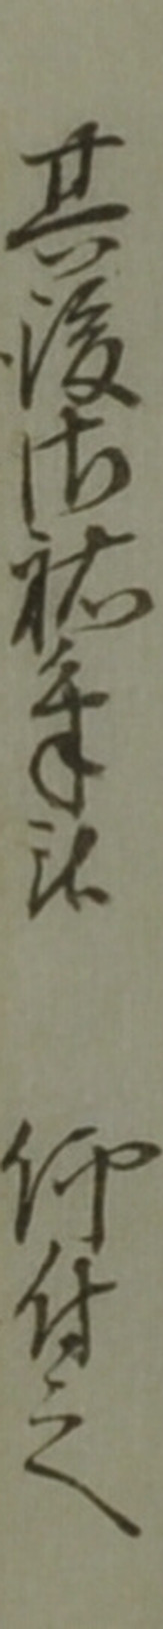其後御祐筆被仰付之
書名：諸御役代々録（八）
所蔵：伊那市立高遠町図書館・合同会社AMANE
